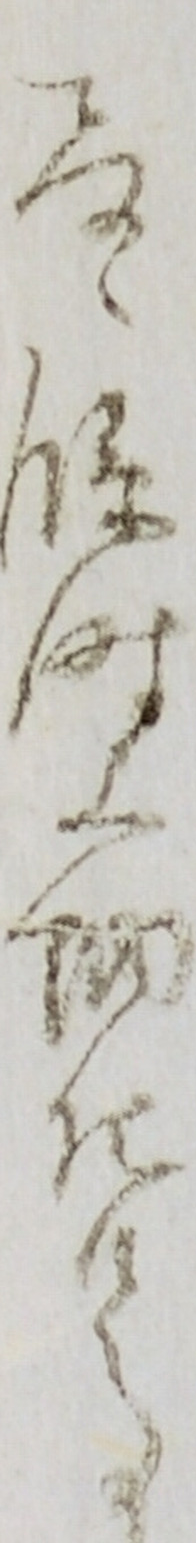局へ臨時上納仕候事
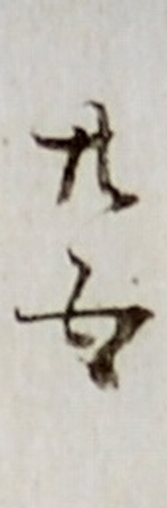廿五日
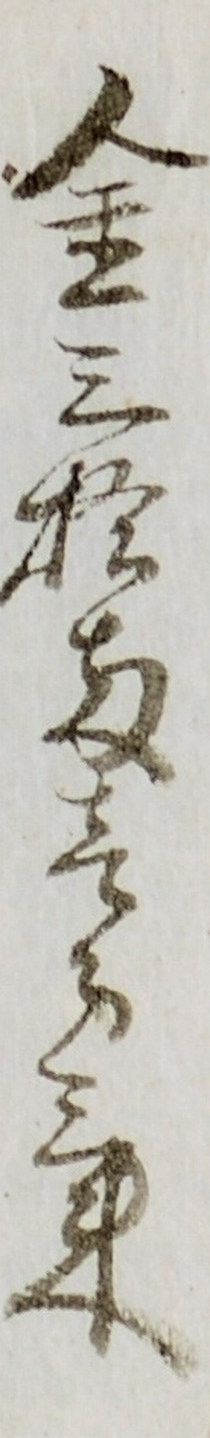金三拾両壱分三朱
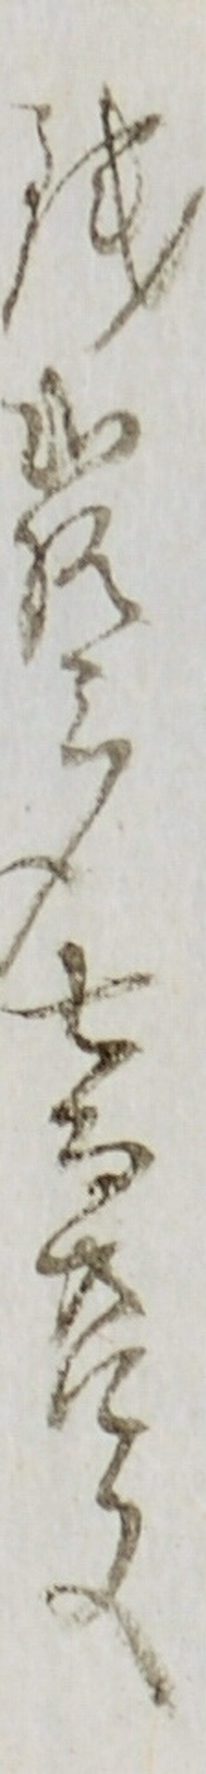銭弐拾三貫七百廿四文
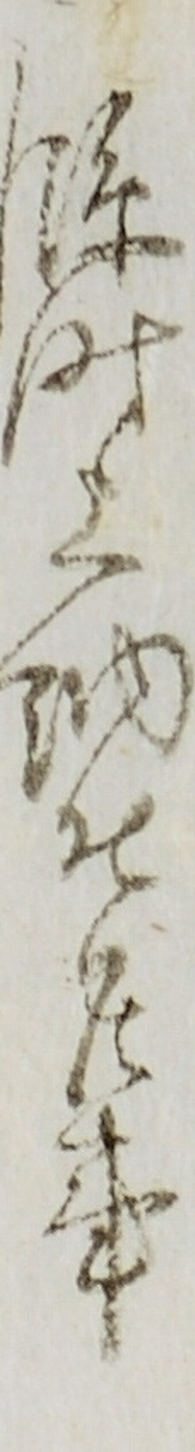臨時上納仕候事
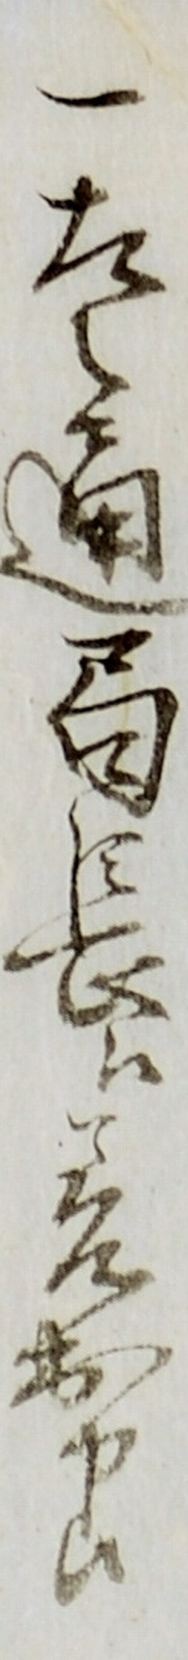一左之通局長え差出申候

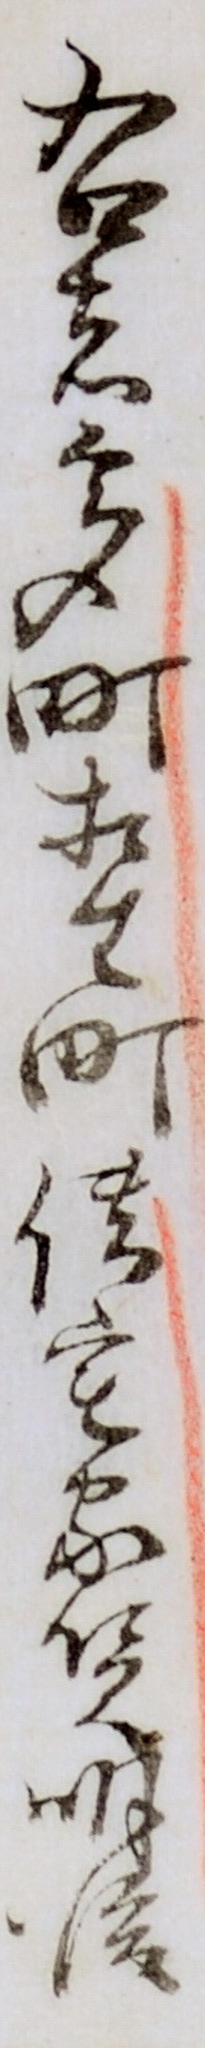右は多町相生町借宅家賃明後
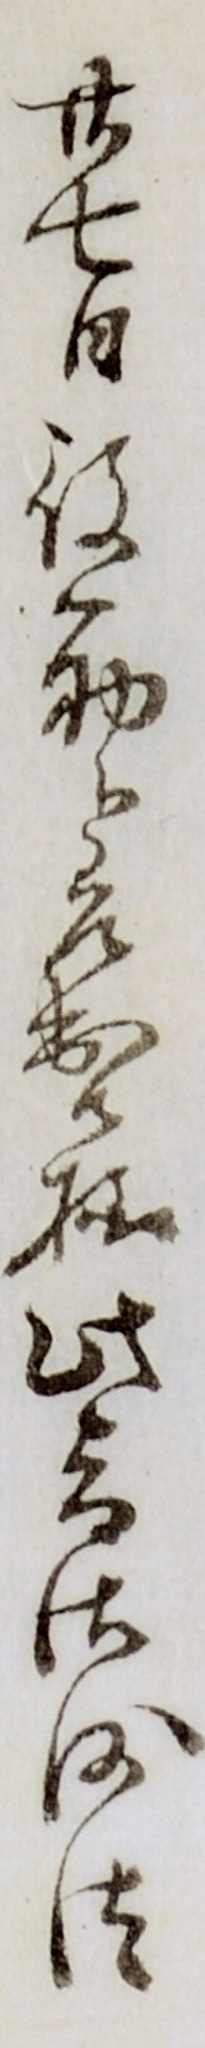廿七日役筋え差出候様此旨御沙汰
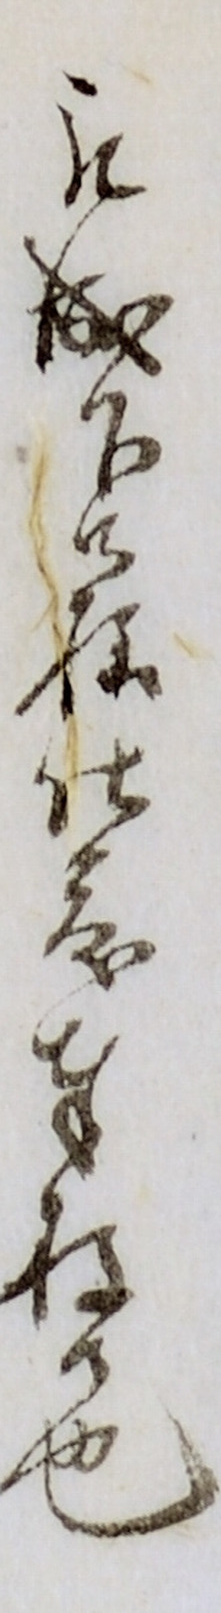被成下候様仕度奉存候也
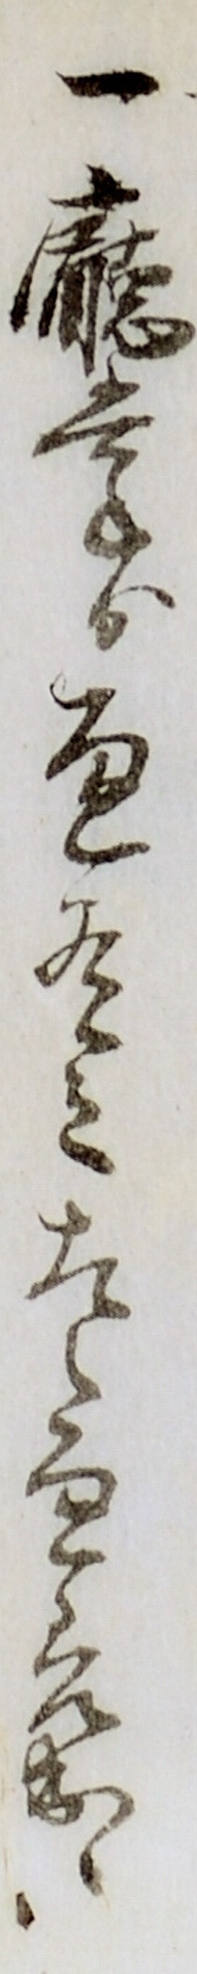一庁掌ゟ通有之左之通差出候
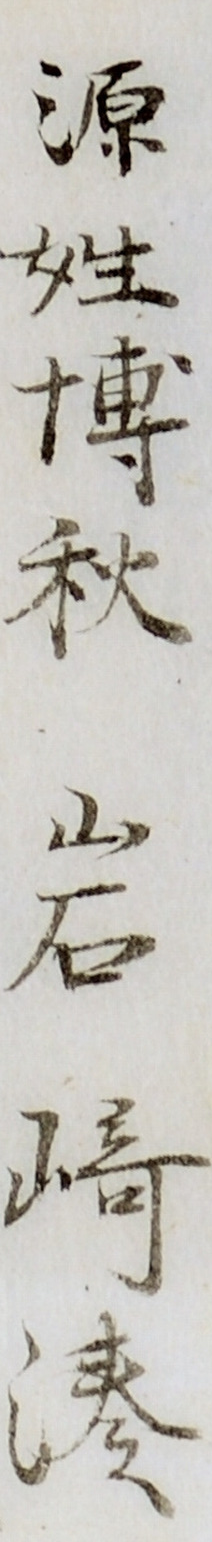源姓博秋岩崎湊
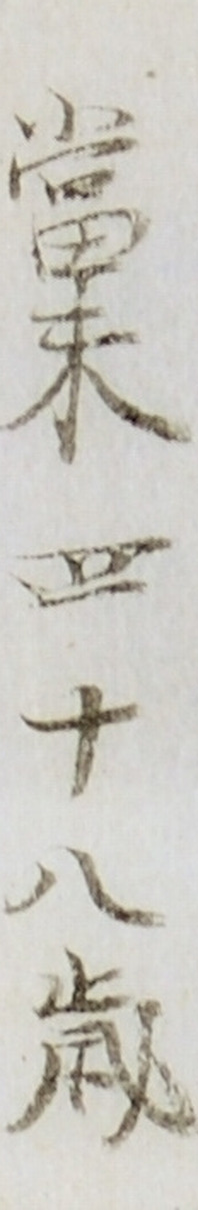当未四十八歳
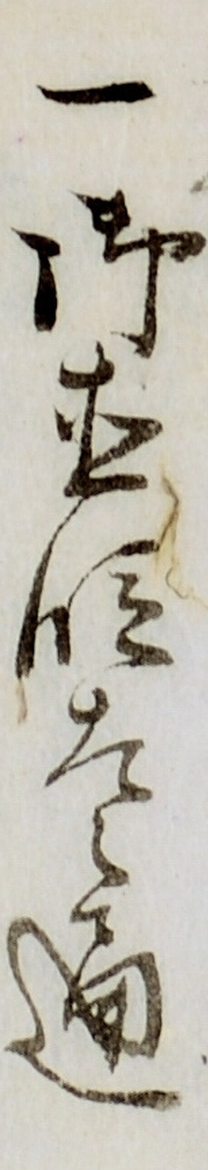一御直段左之通
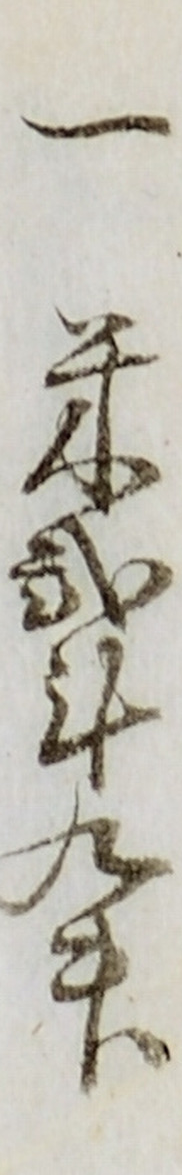一米二斗九升金納
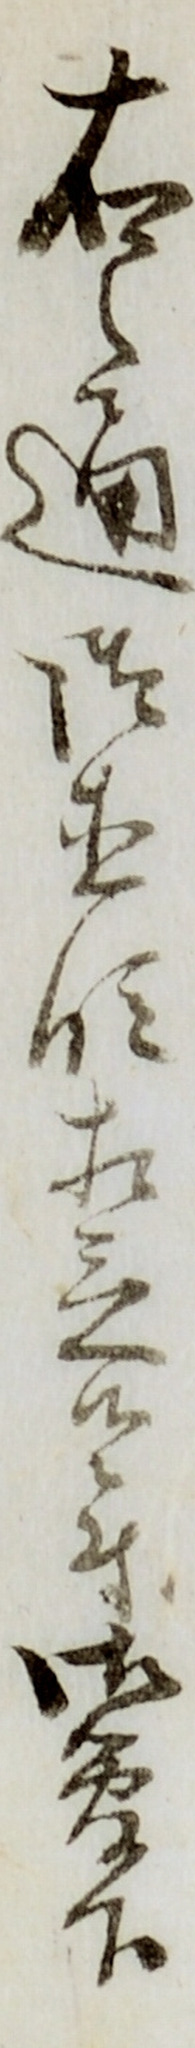右之御直段相立候に付御管下
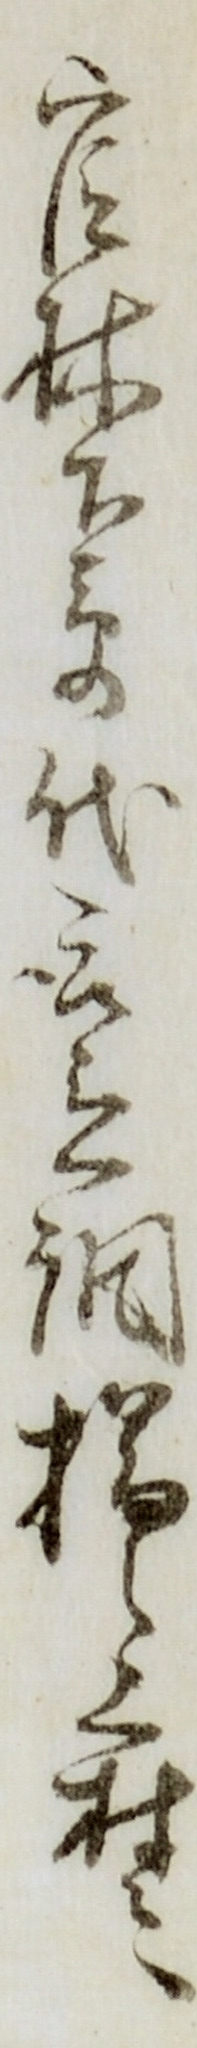官林下草代取立調揚之上村々へ
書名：山林方諸事御用留
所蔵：伊那市立高遠町図書館・合同会社AMANE
